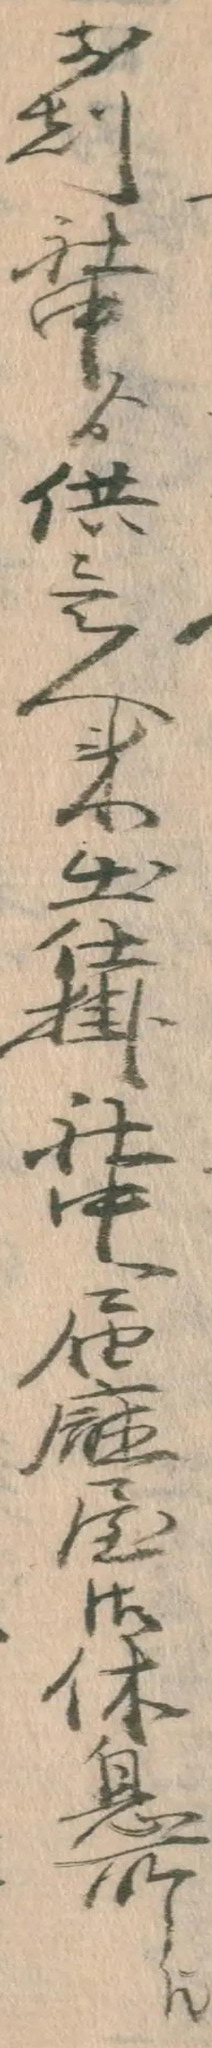前刻社中ゟ供壱人来出仕掛社中へ届庁屋御休息所え
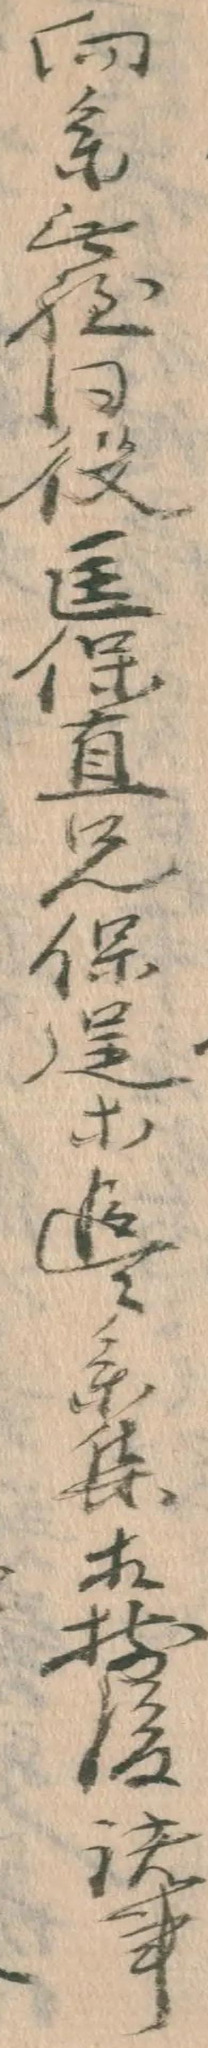向参無程同役匡保直兄保逞等追々参集相揃後諸事
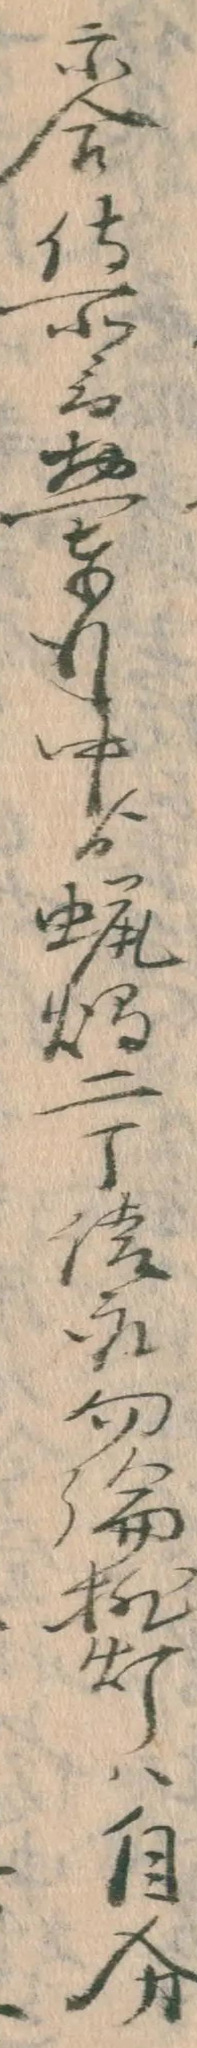示合侍所ニ而惣奉行中ゟ蝋燭二丁請取勿論挑灯ハ自分
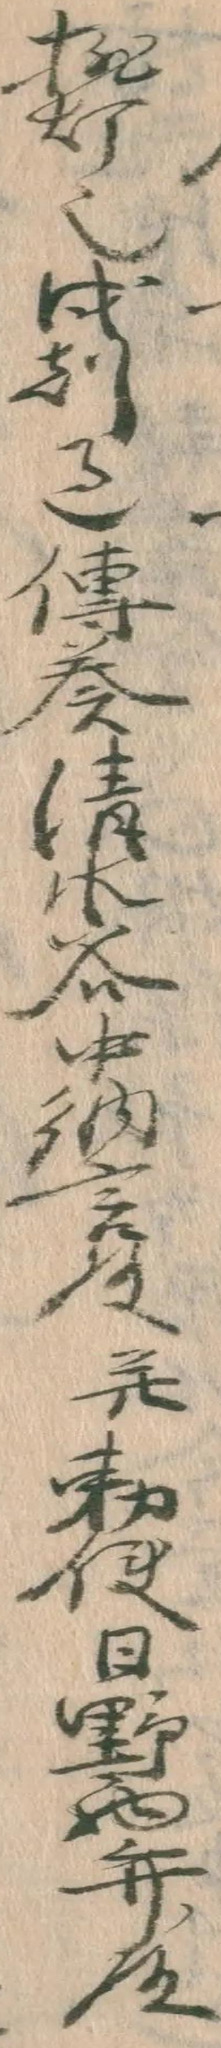挑灯也戌刻過傳奏清水谷中納言殿并勅使日野西弁殿
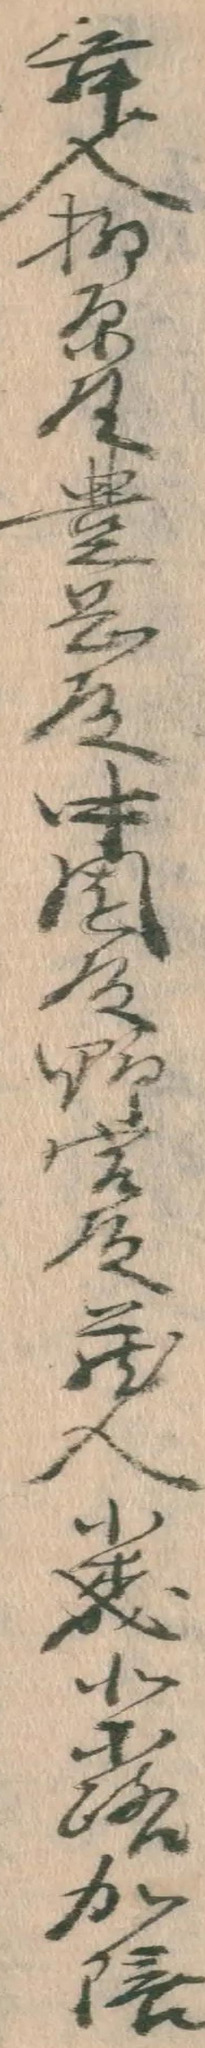舞入柳原殿豊岡殿中岡殿野宮殿蔵人小森北小路加陪
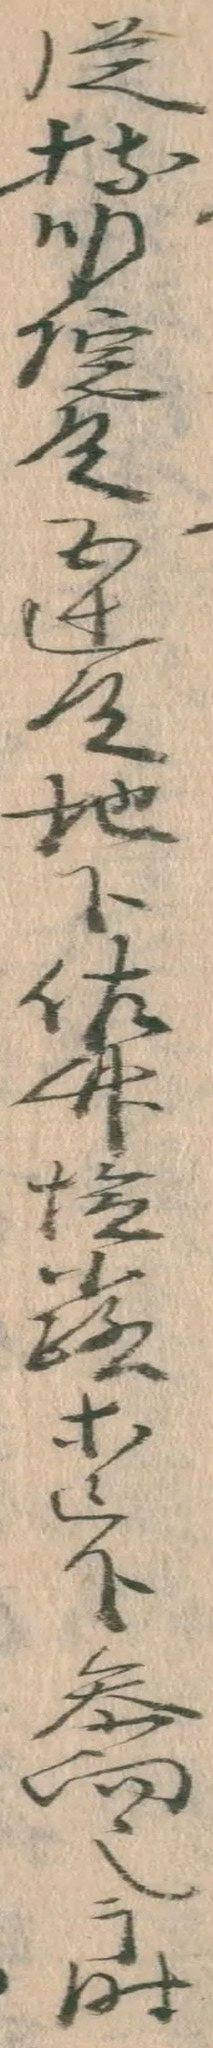従持明院殿五辻殿地下佐竹塩小路等已下参向之于時
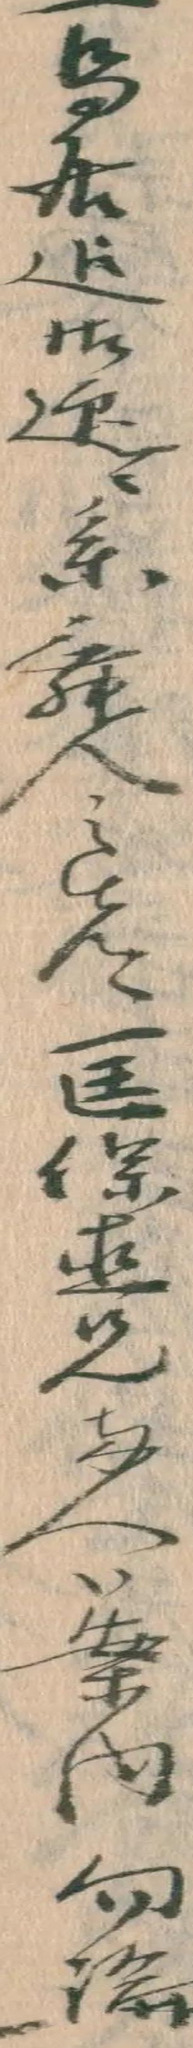一鳥居迄御迎ニ参舞人之先へ匡保直兄両人御案内勿論
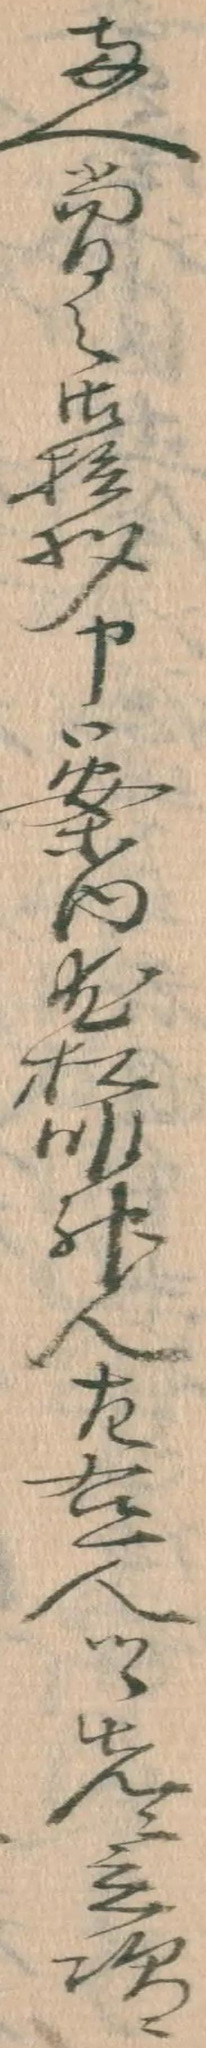両人當日之御挨拶申御案内尤松明神人左右一人ツヽ先ニ立次ニ
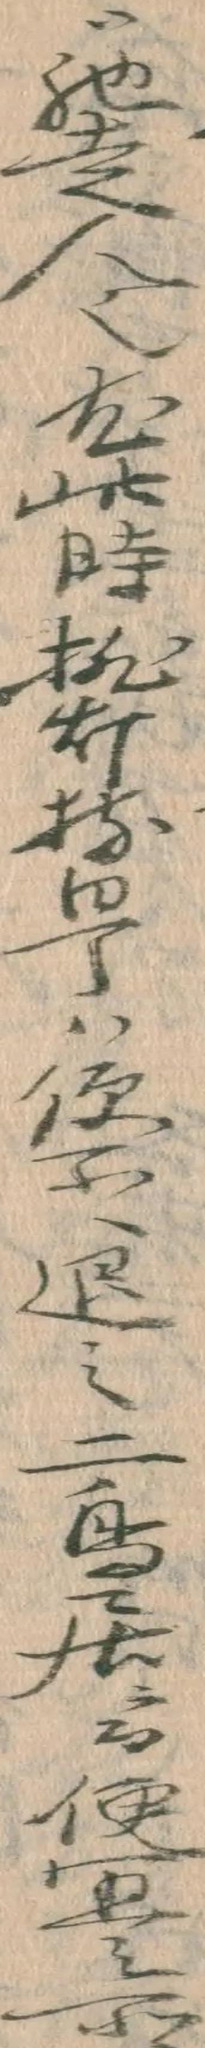御馳走人也尤此時挑灯持白丁ハ便所へ退之二鳥居ニ而便宜之所ニ
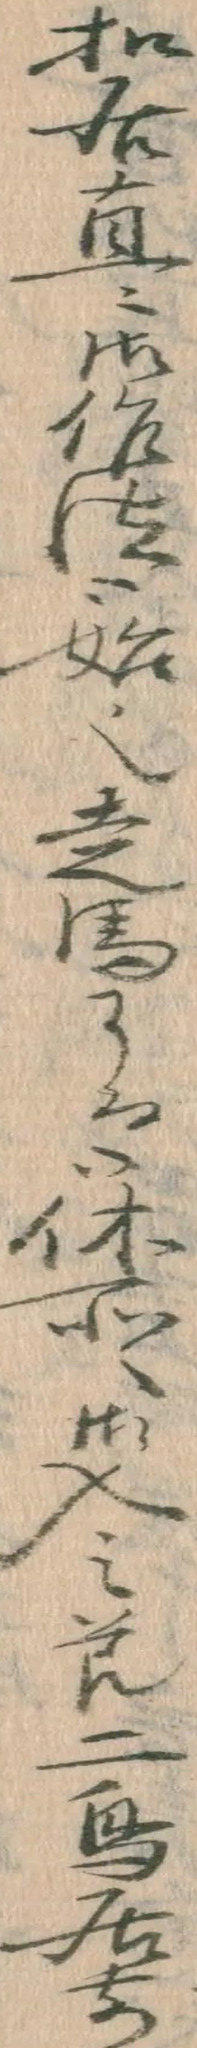扣居直ニ御作法御始也走馬了而御休所へ御入之節二鳥居前
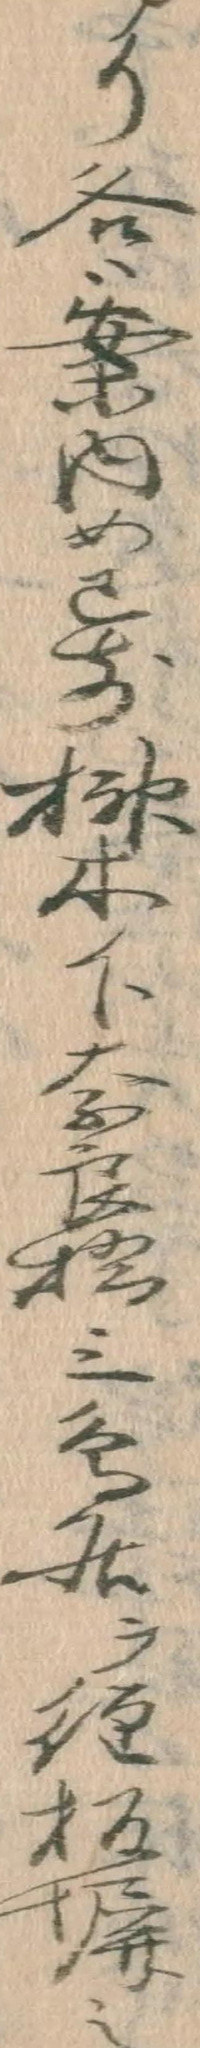より各御案内如已前榊木下奈良橋三鳥居ウィ経板塀之
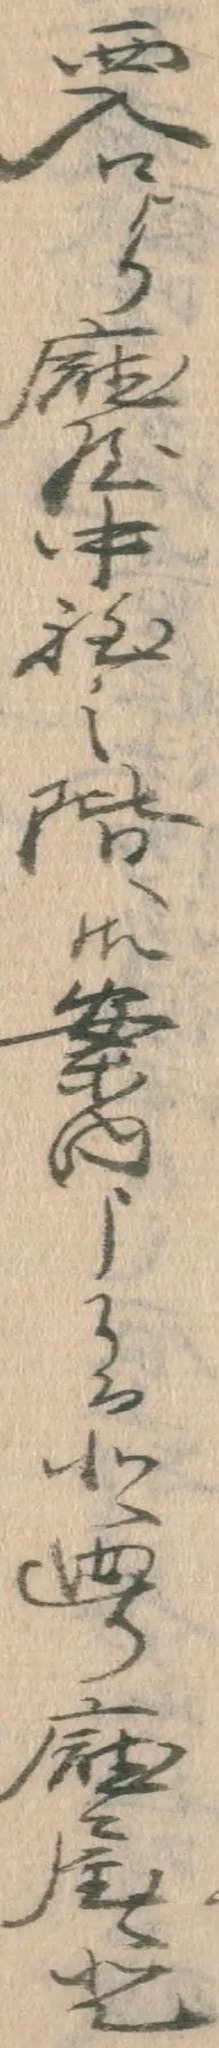西入口より庁屋中程之階へ御案内申了而北へ廻り庁屋へ登
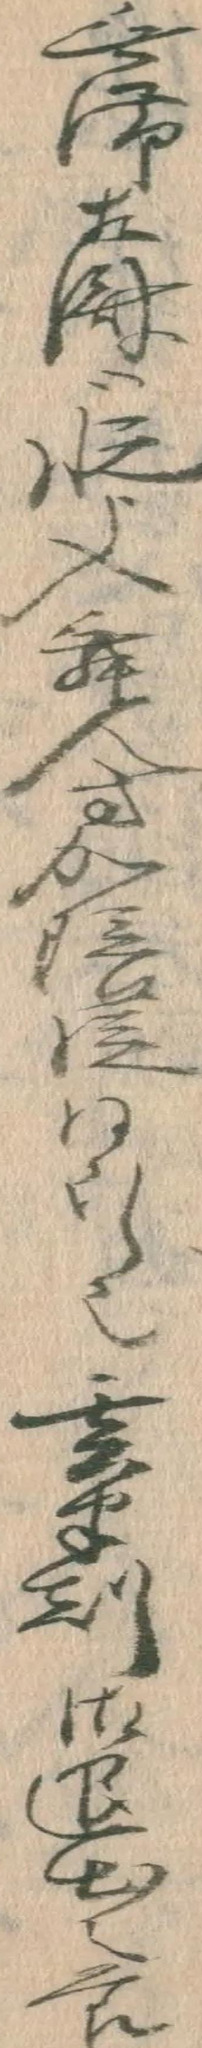無滞相済御祝申入舞人方加陪従同引也亥半刻御退出之節
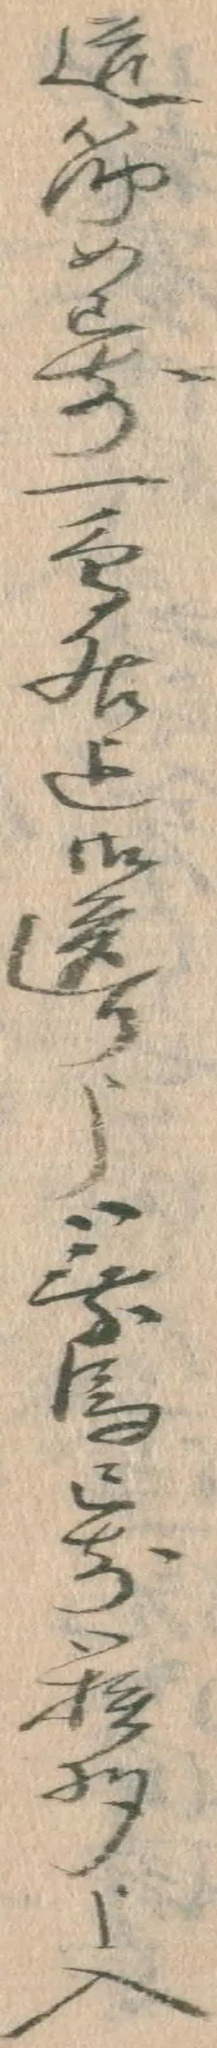道筋如已前一鳥居迄御送り申御乗馬已前御挨拶申入
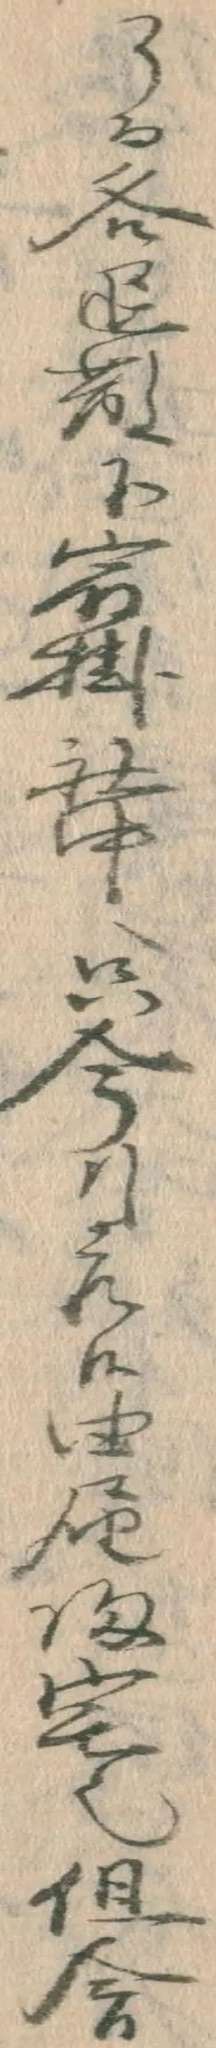了而各追散下宿掛社中へ只今引取候由届帰宅也但今日
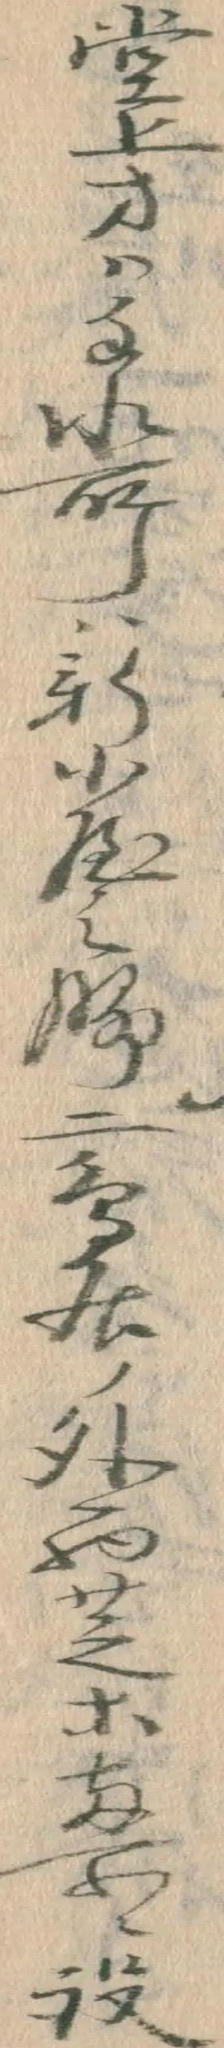堂上方ハ手水所ハ新小屋之脇二鳥居の外西芝等両所に設
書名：賀茂社記録. 第66冊
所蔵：国立国会図書館 National Diet Library, JAPAN
